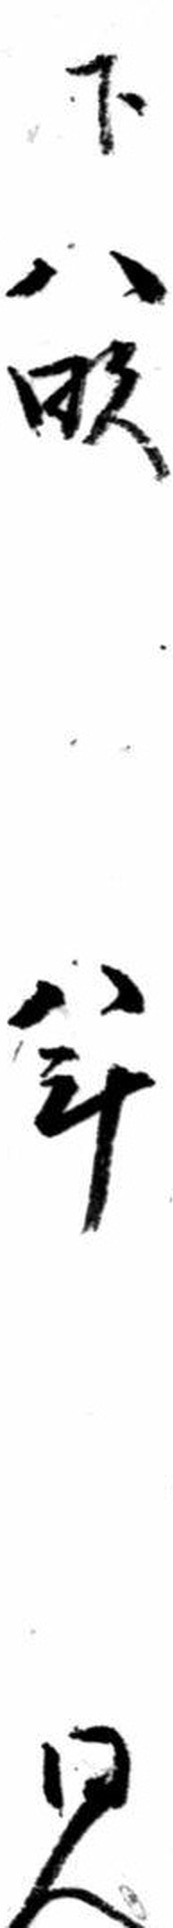下八畝八斗同人
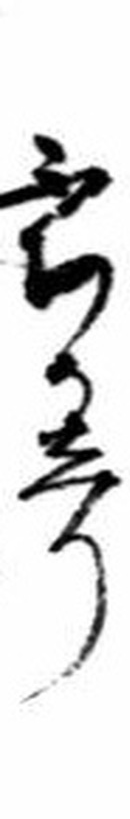ふちかしり
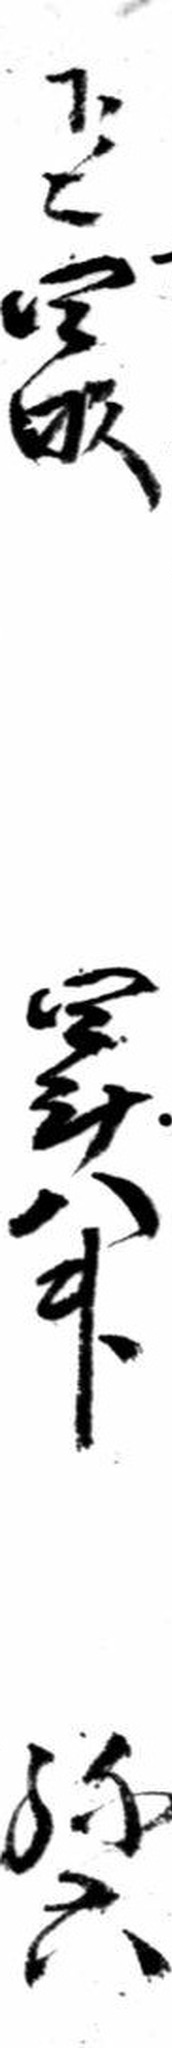下ノ上四畝四斗八升弥六
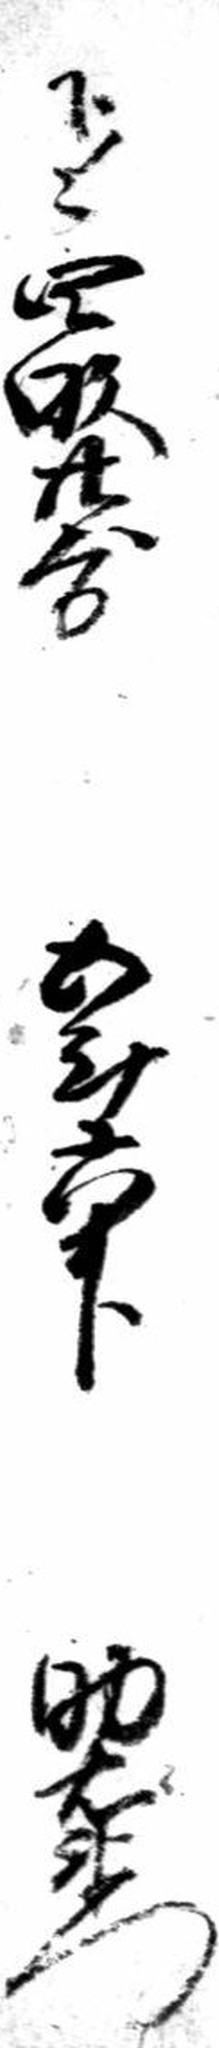下ノ上四畝廿歩五斗六升助右衛門

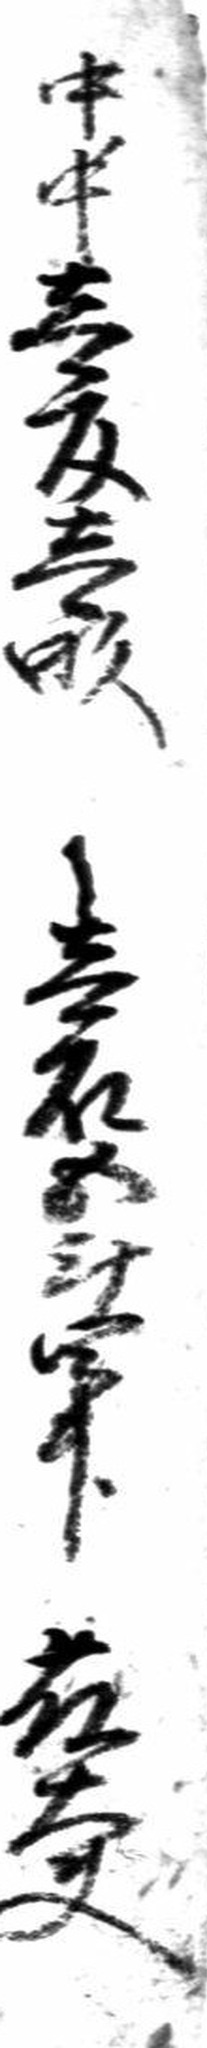中ノ中壱反壱畝壱石五斗四升藤大夫
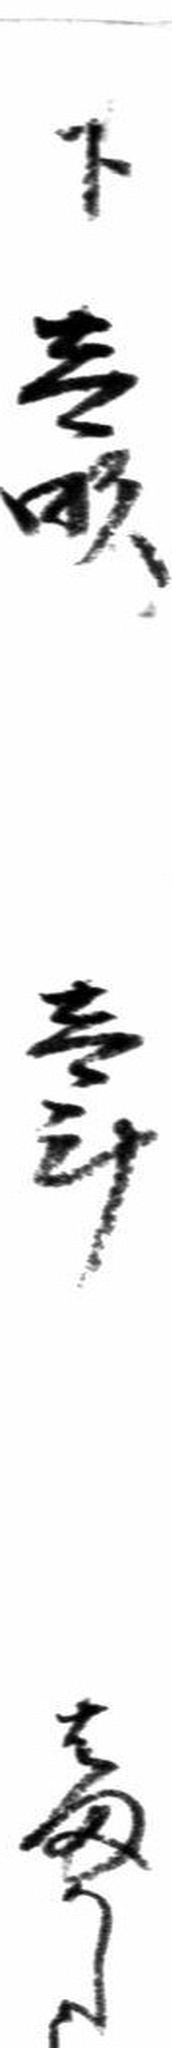下壱畝壱斗はまかしら
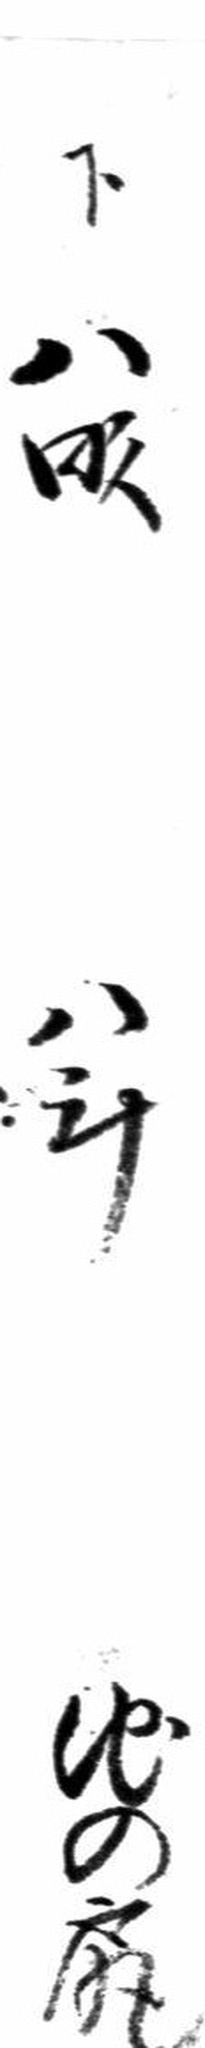下八畝八斗池の尻
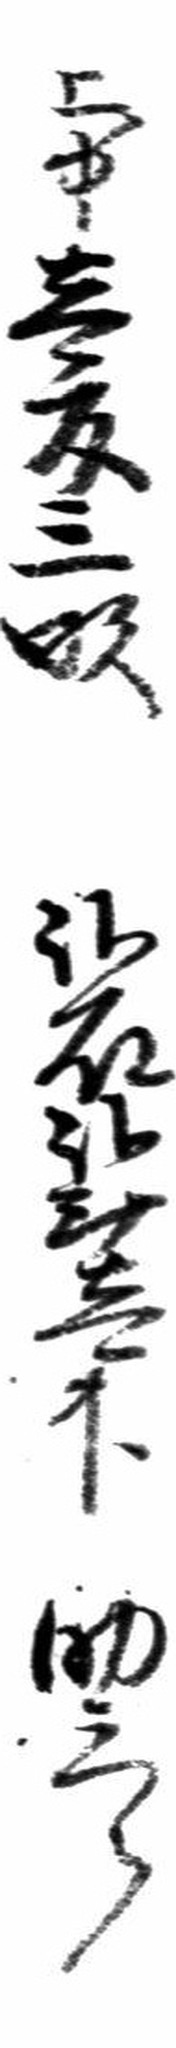上ノ中壱反三畝弐石弐斗壱升助三郎
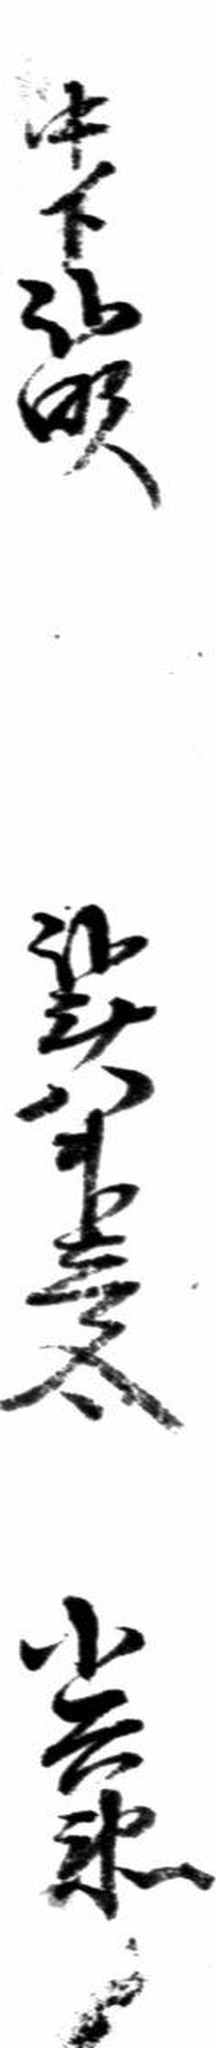中ノ下弐畝弐斗八升壱合小兵衛
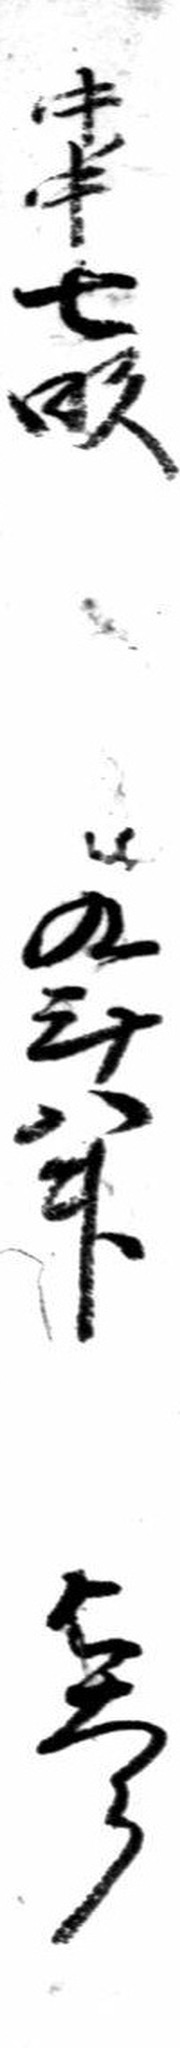中ノ中七畝九斗八升与大郎
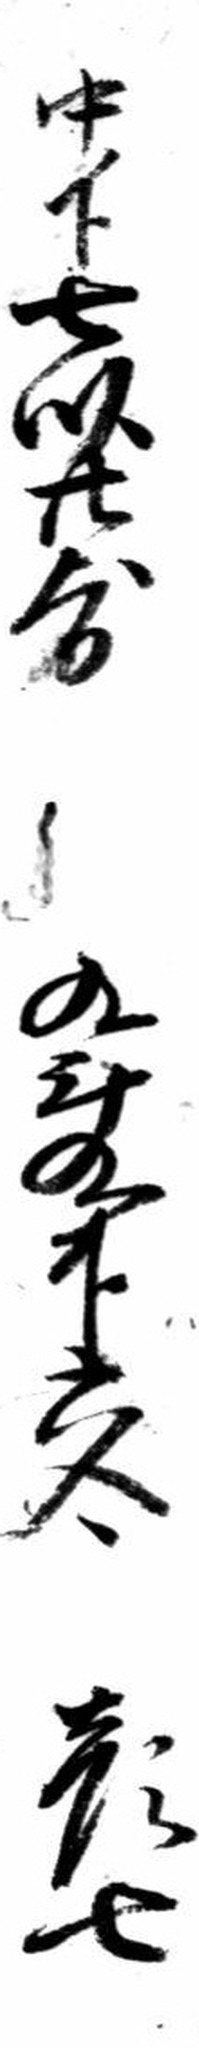中下七畝廿歩九斗九升六合彦七
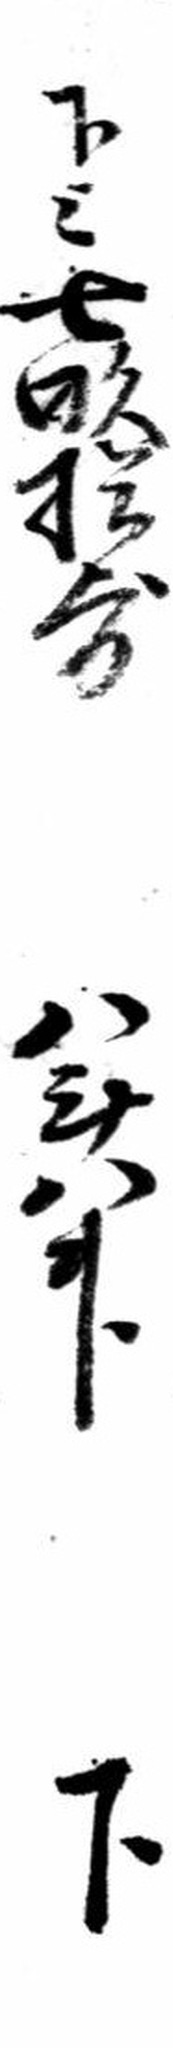下上七畝拾歩八斗八升下
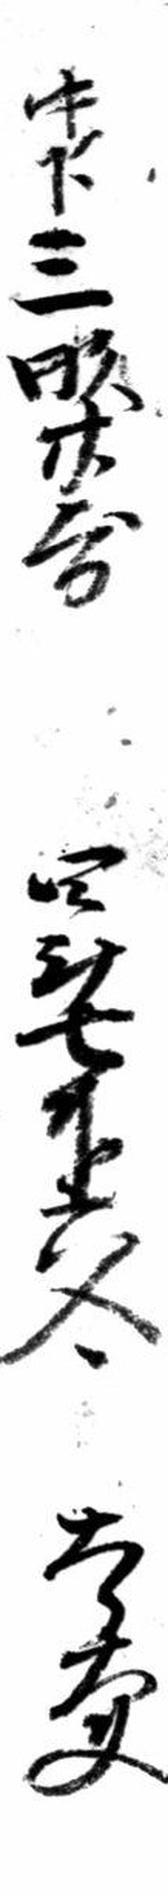中ノ下三畝廿歩四斗七升六合大郎大夫
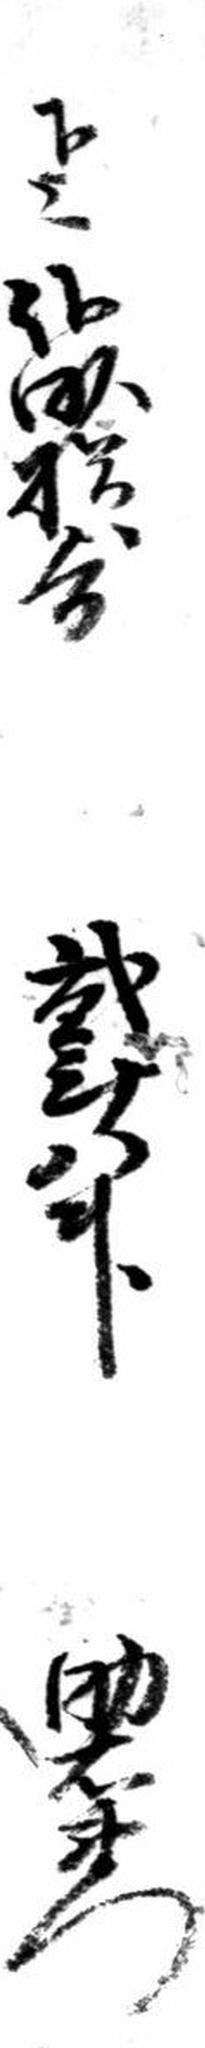下上弐畝拾歩弐斗八升助右衛門
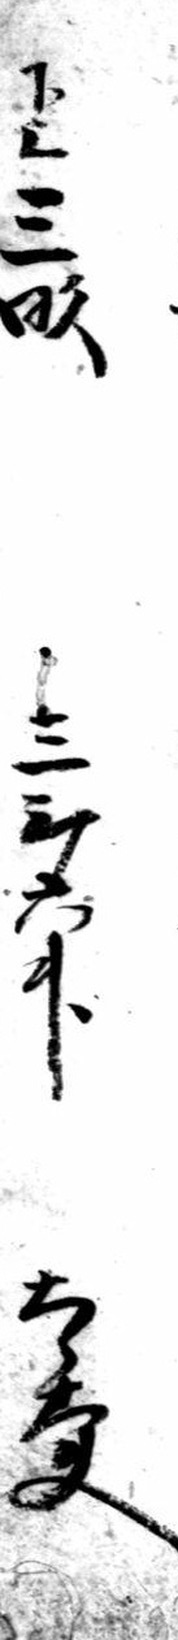下上三畝三斗六升大郎大夫

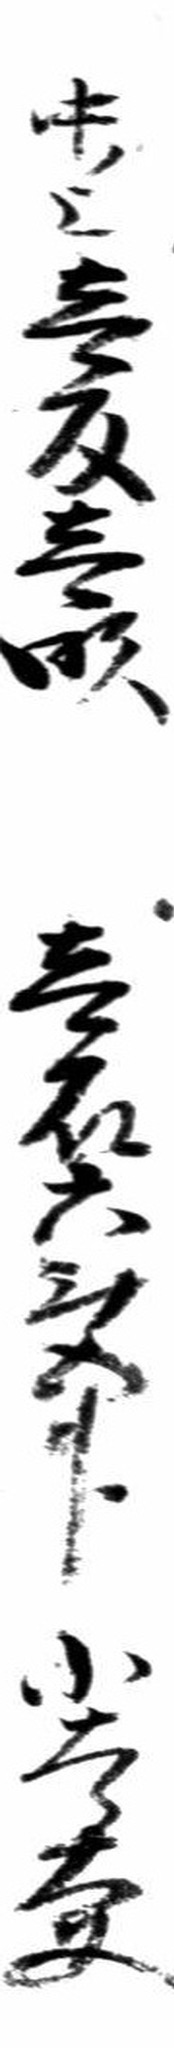中ノ上壱反壱畝壱石六斗五升小大郎大夫
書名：若州三方郡之内世久見浦御検地帳（世久見浦検地帳写）
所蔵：福井県文書館 Fukui Prefectural Archives
